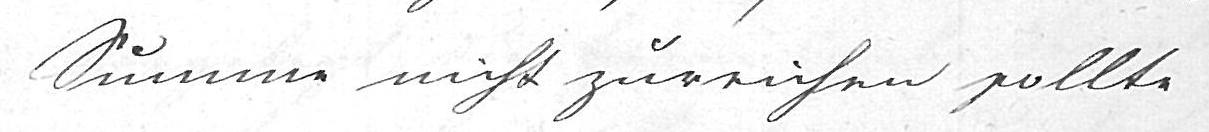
Summe nicht zureichen sollte
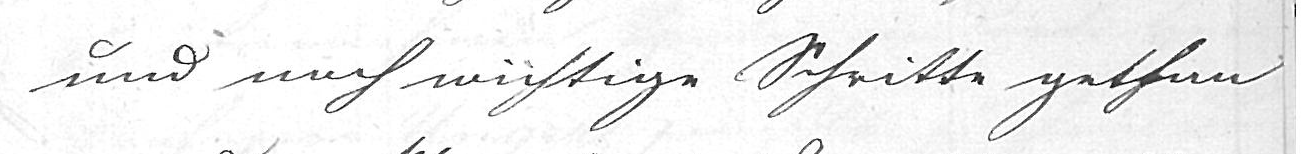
und noch wichtigen Schritte gethan
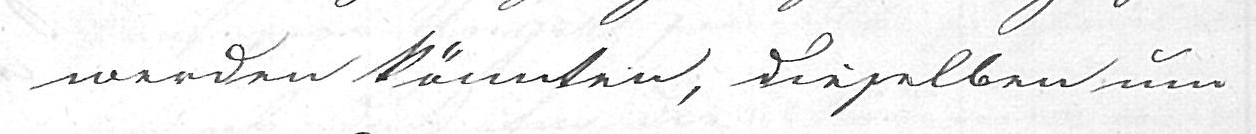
werden könnten, dieselben um
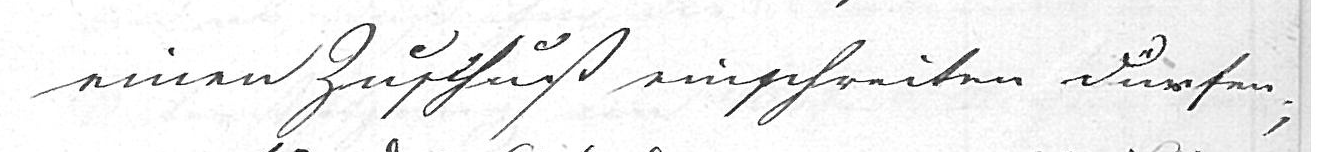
einen Zuschuß einschreiten dürfen;
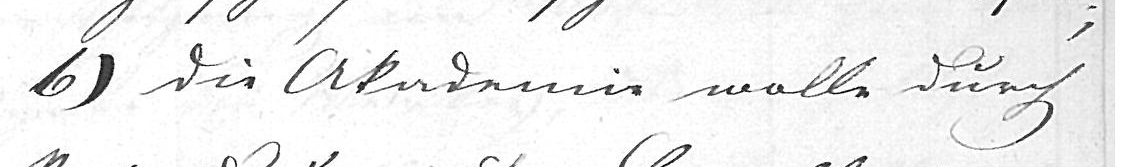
b) die Akademie wolle durch
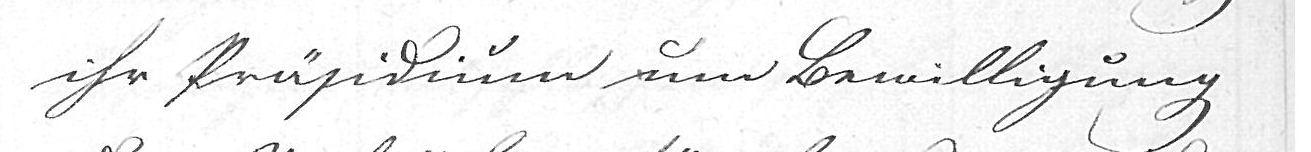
ihr Präsidium um Bewilligung
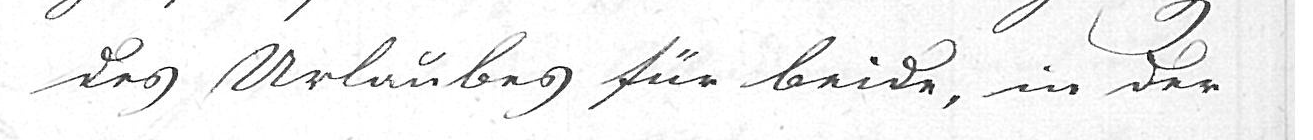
des Urlaubes für beide, in der
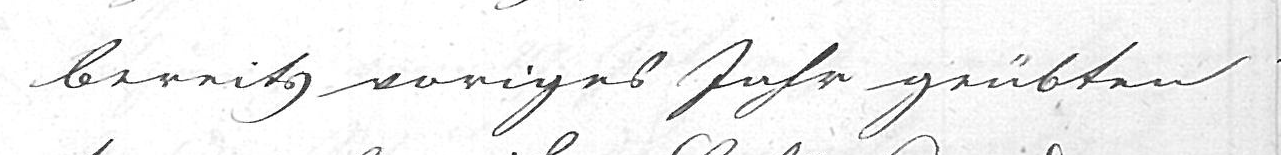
bereits voriges Jahr geübten
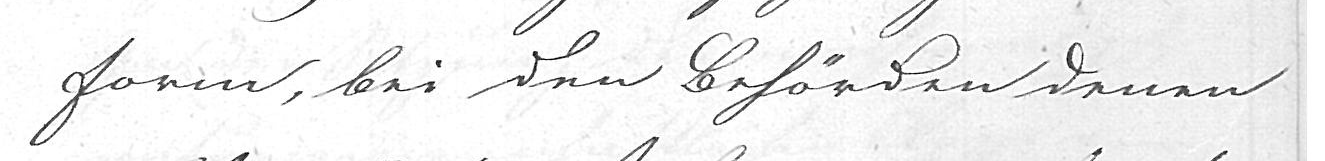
Form, bei den Behörden denen
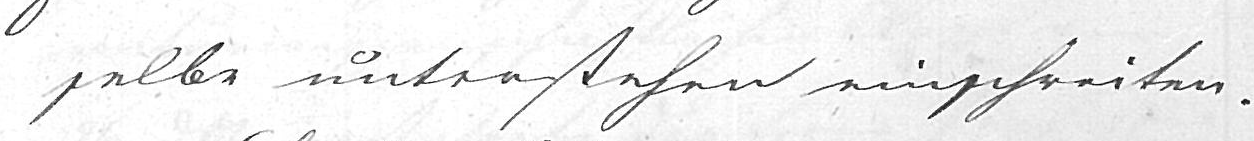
selbe unterstehen einschreiten.
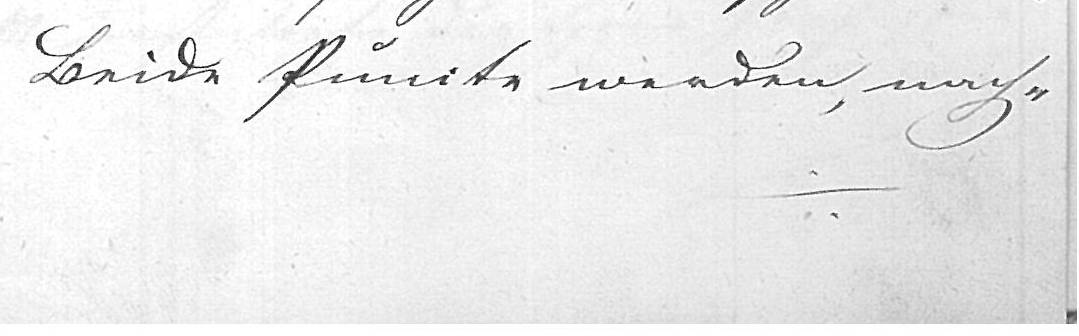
Beide Puncte werden, nach-
